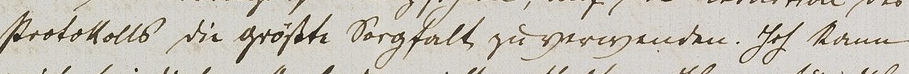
Protokolls die größte Sorgfalt zu verwenden. Ich kann
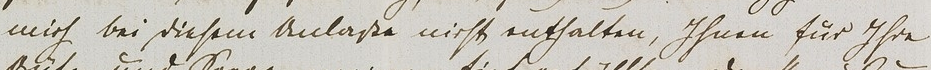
mich bei diesem Anlaße nicht enthalten, Ihnen für Ihre
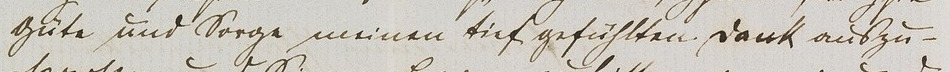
Güte und Sorge meinen tief gefühlten Dank auszu-
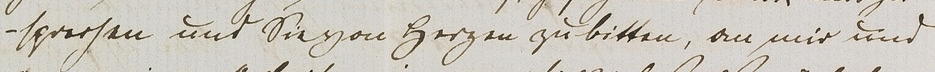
sprechen und Sie von Herzen zu bitten, an mir und
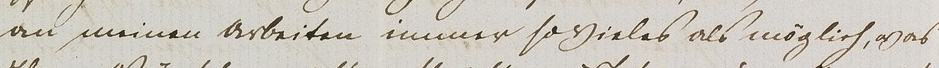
an meinen Arbeiten immer so Vieles als möglich, was
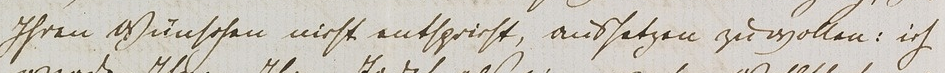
Ihren Wünschen nicht entspricht, aussetzen zu wollen: ich
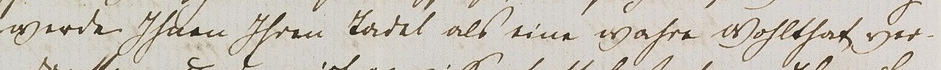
werde Ihnen Ihren Tadel als eine wahre Wohlthat ver-
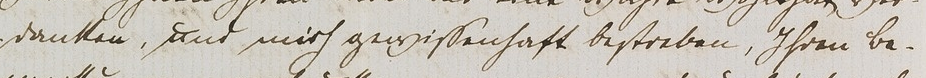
danken, und mich gewissenhaft bestreben, Ihren Be-
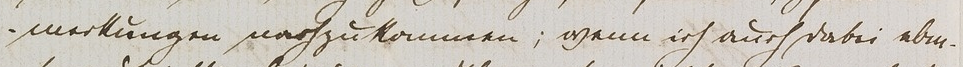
merkungen nachzukommen; wenn ich auch dabei eben-
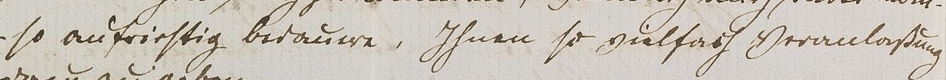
so aufrichtig bedauere, Ihnen so vielfach Veranlaßung
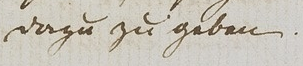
dazu zu geben.
